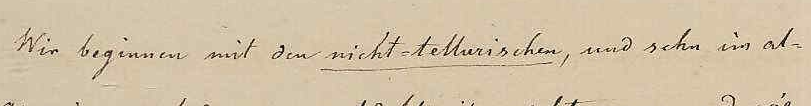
Wir beginnen mit den nicht-tellurischen, und sehn im al-
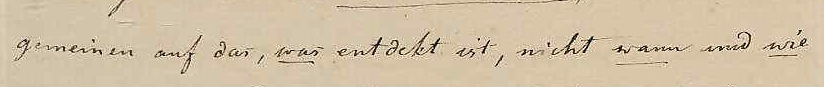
gemeinen auf das, was entdekt ist, nicht wann und wie
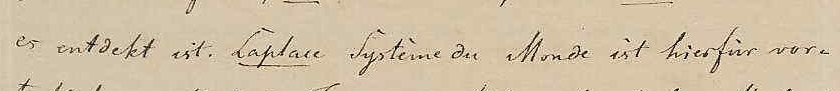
es entdekt ist. Laplace Système du Monde ist hierfür vor-
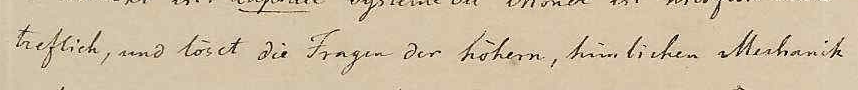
treflich, und löset die Fragen der höhern, Mechanik
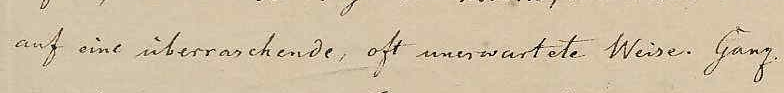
auf eine überraschende, oft unerwartete Weise. Ganz
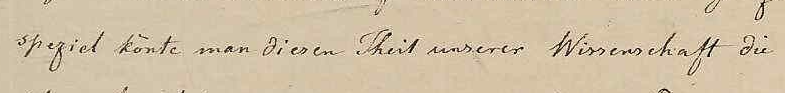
speziel könte man diesen Theil unserer Wissenschaft die
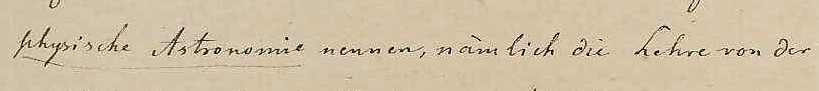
physische Astronomie nennen, nämlich die Lehre von der
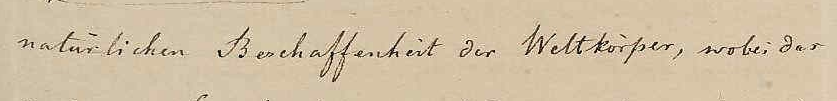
natürlichen Beschaffenheit der Weltkörper, wobei das
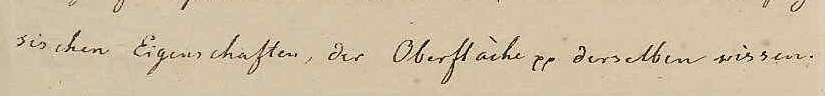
sischen Eigenschaften, der Oberfläche pp derselben wissen.
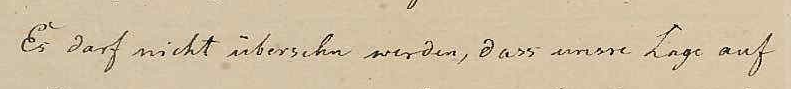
Es darf nicht übersehn werden, dass unsre Lage auf
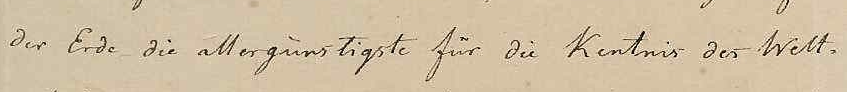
der Erde die allergünstigste für die Kentnis des Welt-
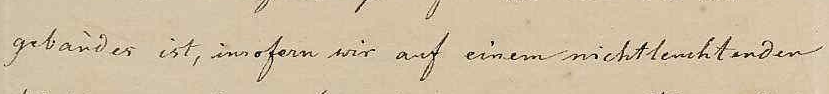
gebäudes ist, insofern wir auf einem nichtleuchtenden
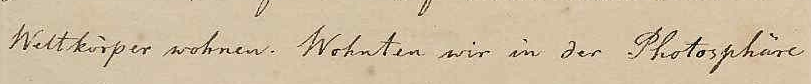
Weltkörper wohnen. Wohnten wir in der Photosphäre
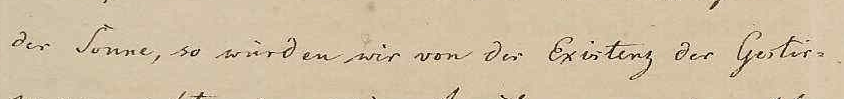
der Sonne, so würden wir von der Existenz der Gestir-
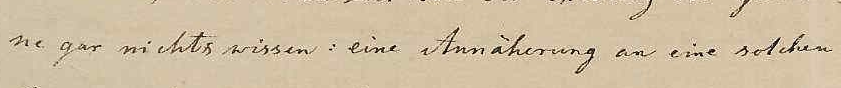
ne gar nichts wissen: eine Annäherung an solchen
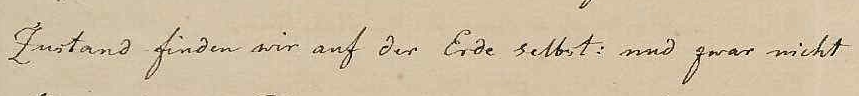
Zustand finden wir auf der Erde selbst: und zwar nicht
